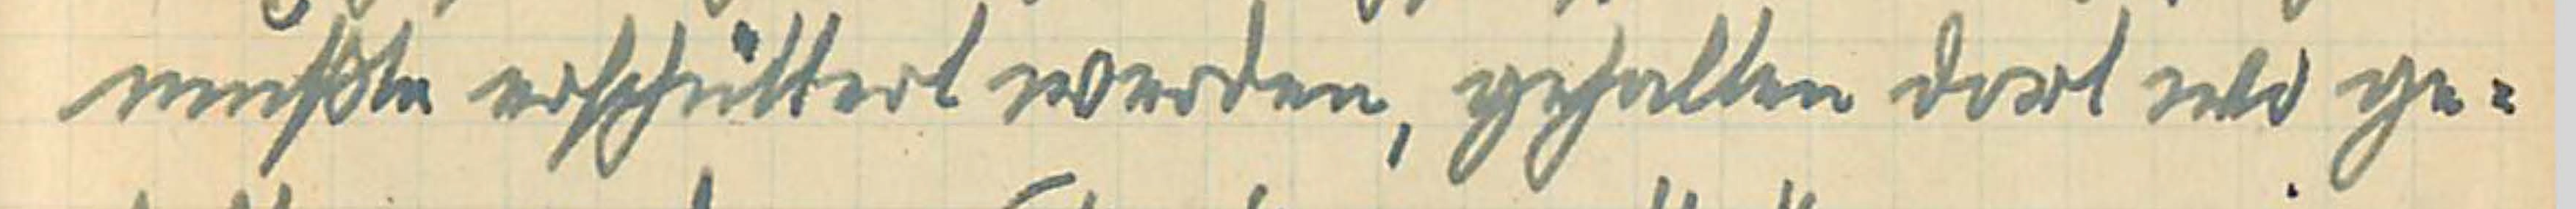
mußte erschüttert werden, gehalten dort wo ge-
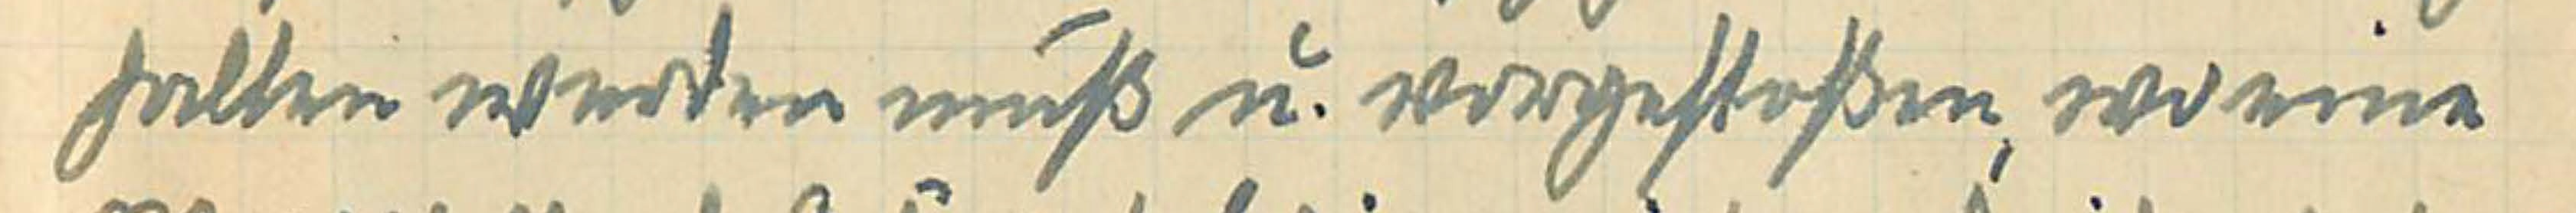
halten werden muß u. vorgestoßen, wo eine
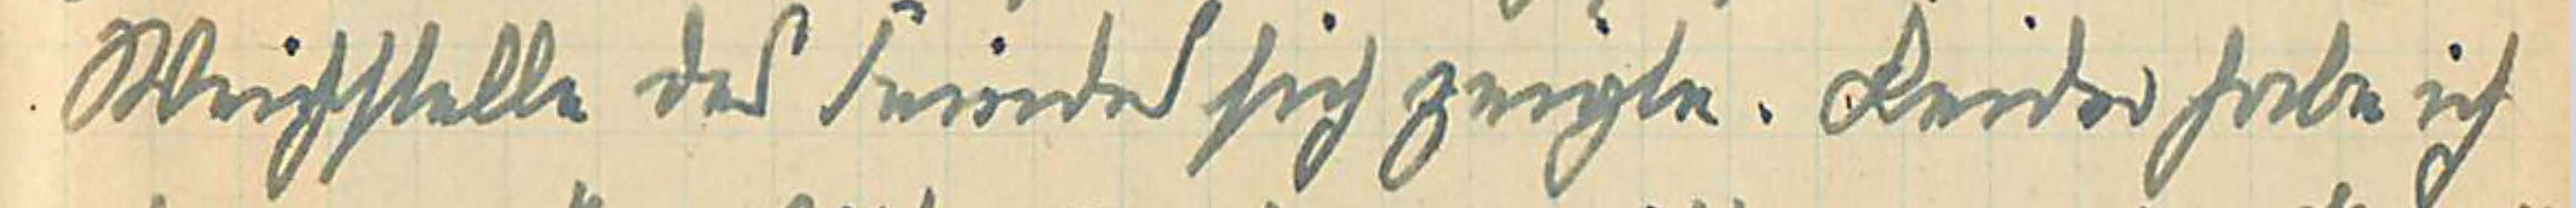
Weichstelle des Feindes sich zeigte. Leider habe ich
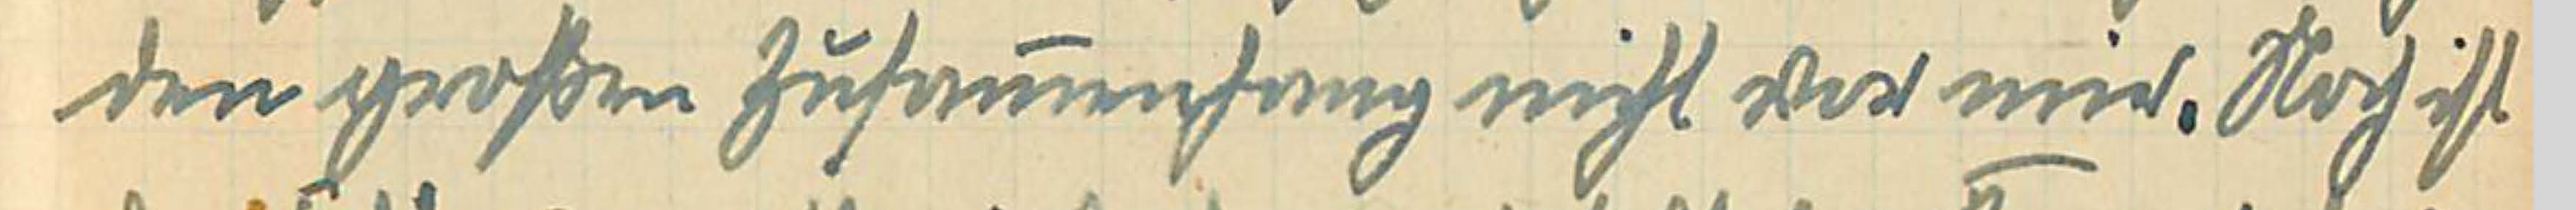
den großen Zusammenhang nicht vor mir. Noch ist
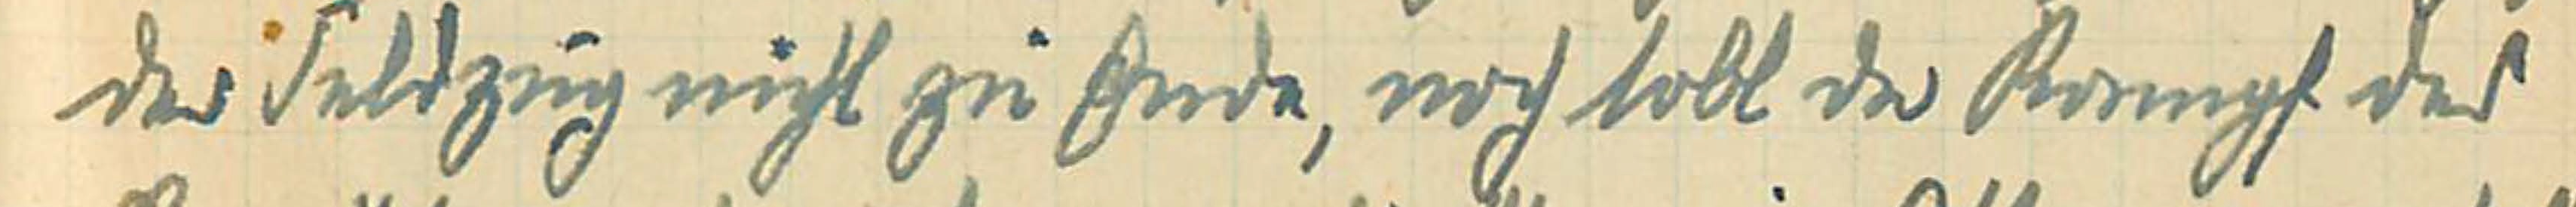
der Feldzug nicht zu Ende, noch tobt der Kampf des
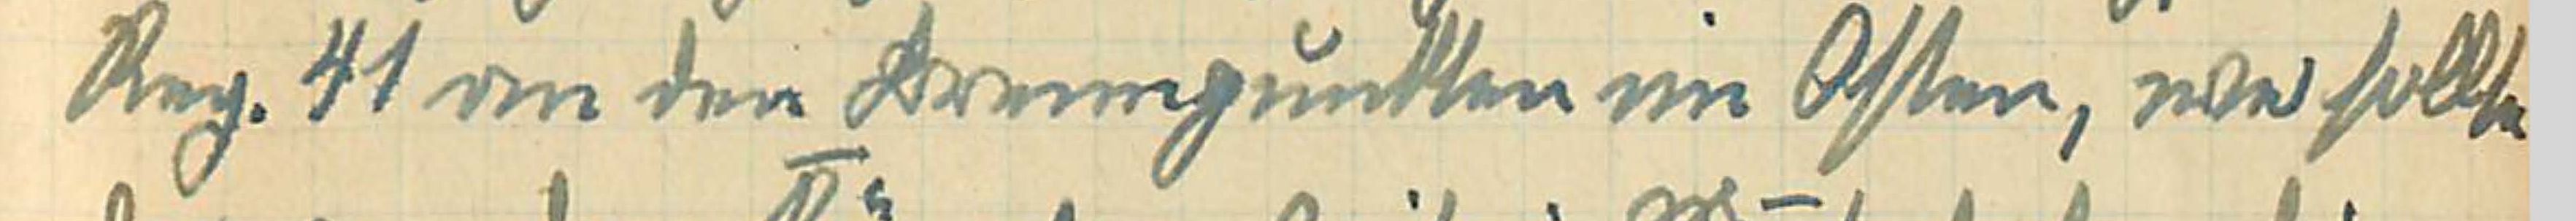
Reg. 41 an den Brennpunkten im Osten, wer sollte
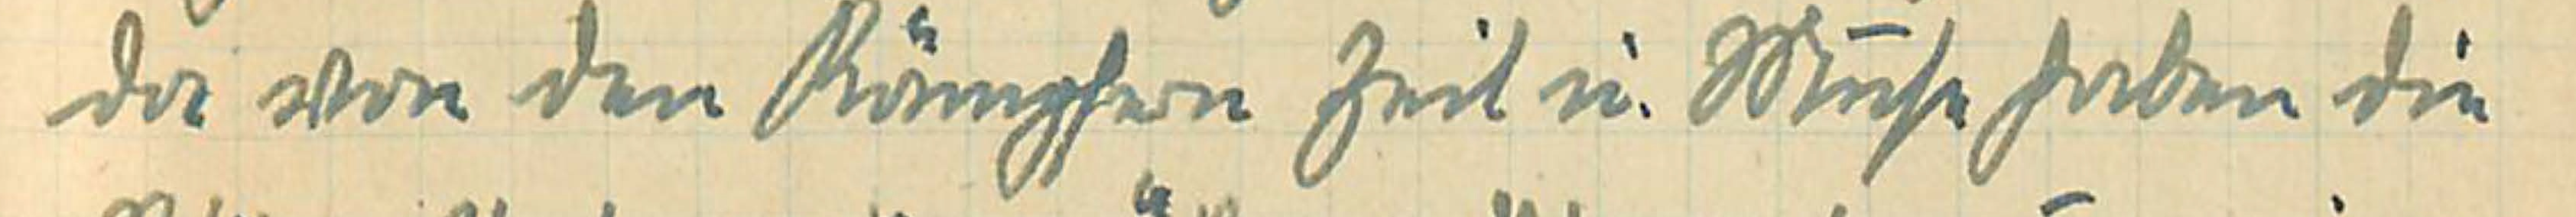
da von den Kämpfern Zeit u. Muse haben die
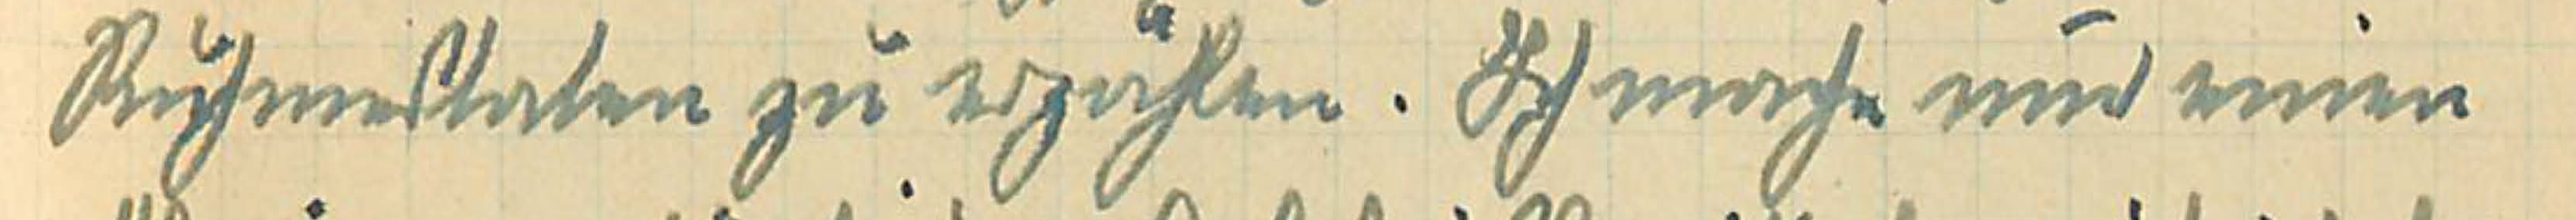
Ruhmestaten zu erzählen. Ich mache nur einen
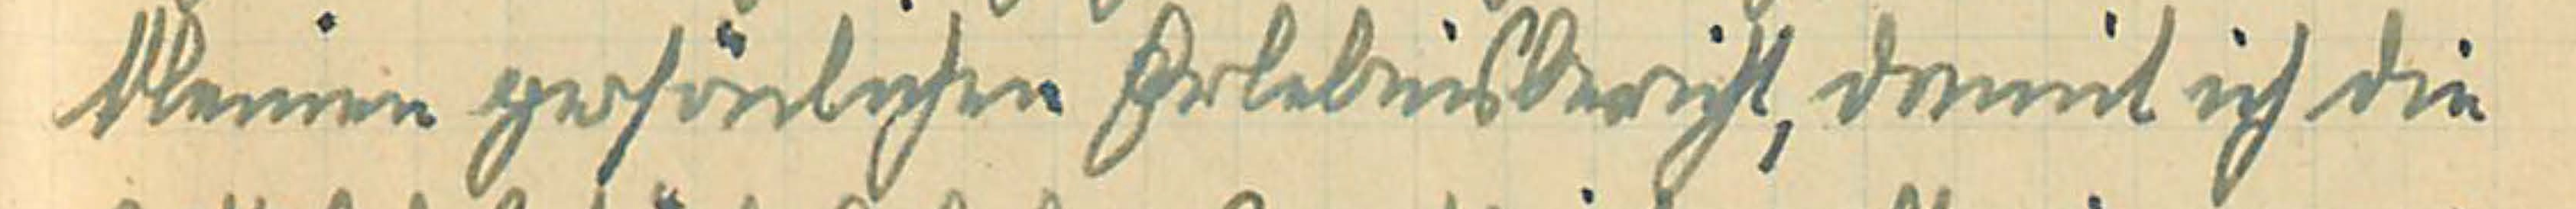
kleinen persönlichen Erlebnisbericht, damit ich die
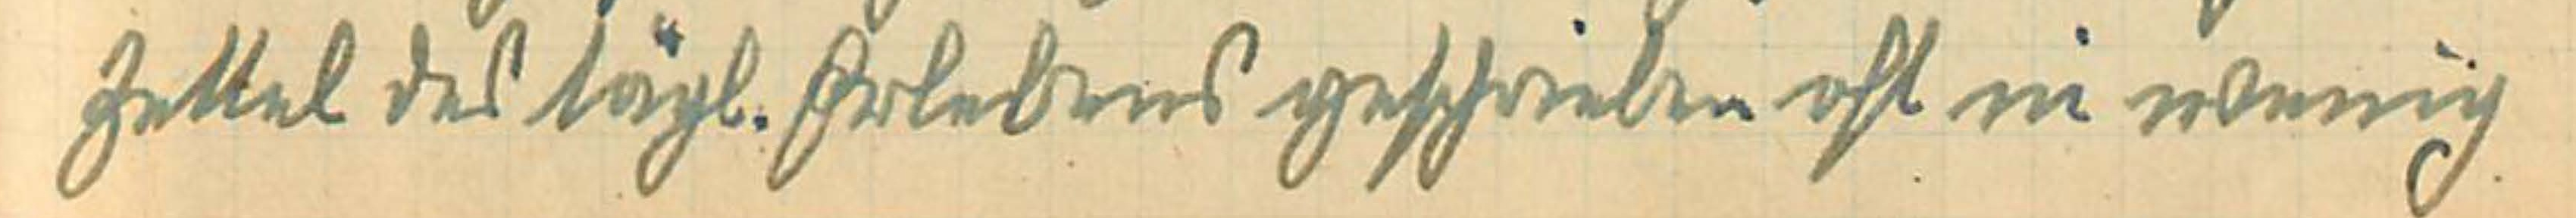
Zettel des tägl. Erlebens geschrieben oft in wenig
